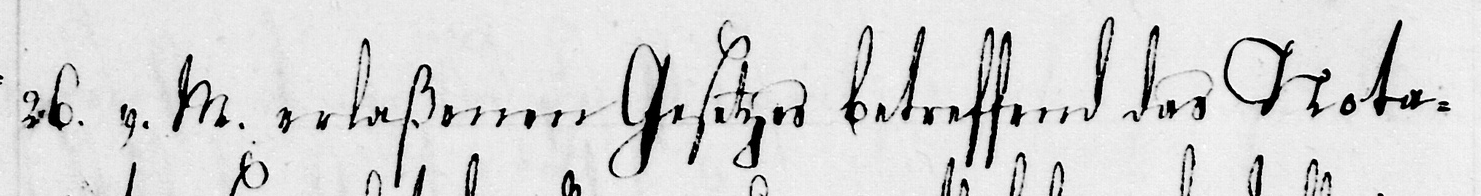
26. v. M. erlaßenen Gesetzes betreffend das Nota¬
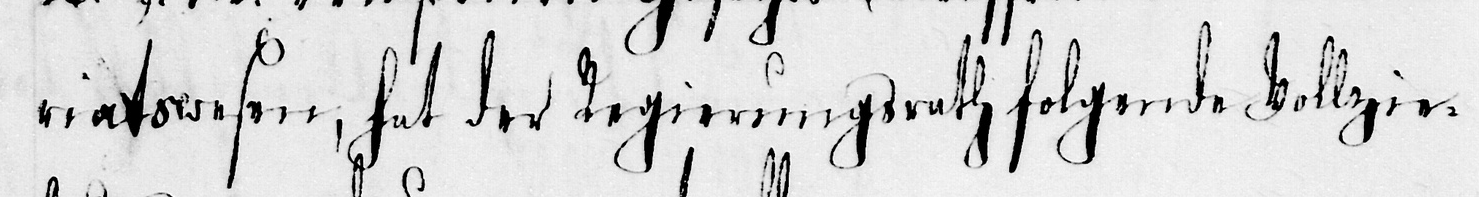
riatswesen, hat der Regierungsrath folgende Vollzie¬
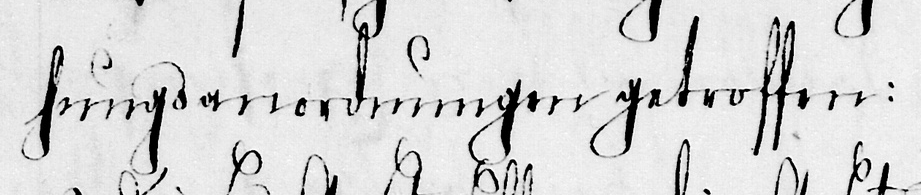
hungsanordnungen getroffen:
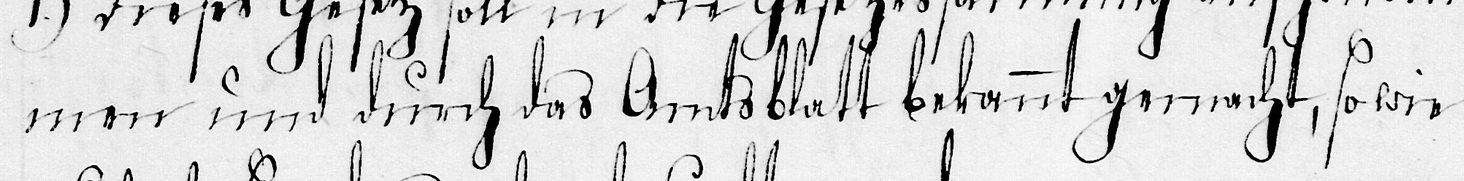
men und durch das Amtsblatt bekannt gemacht, sowie
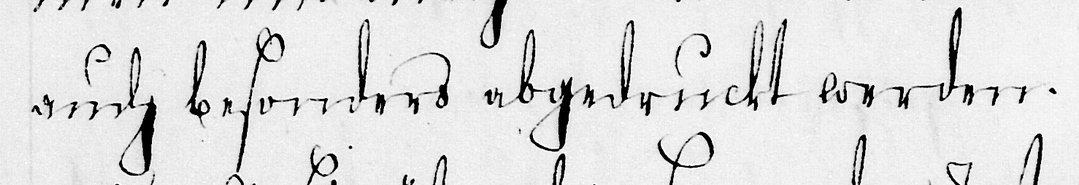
auch besonders abgedruckt werden.
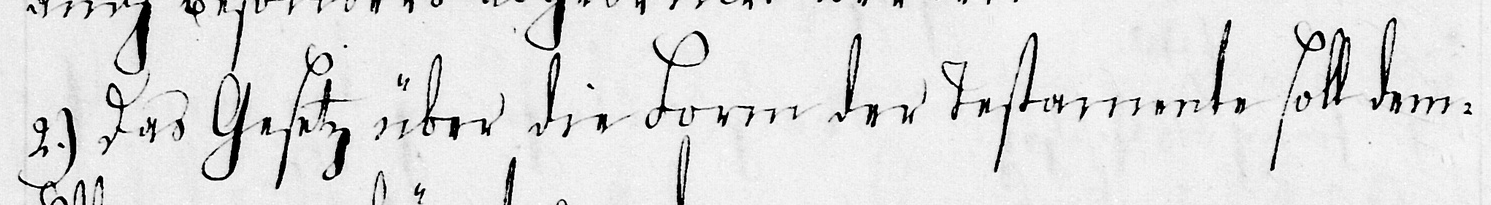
2.) Das Gesetz über die Form der Testamente soll dem¬
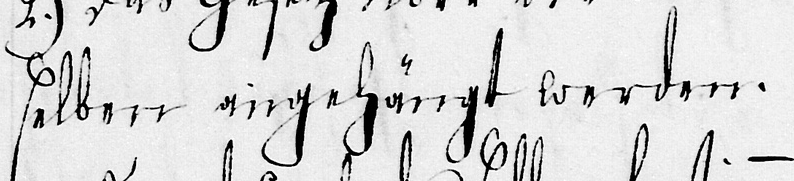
selben angehängt werden.
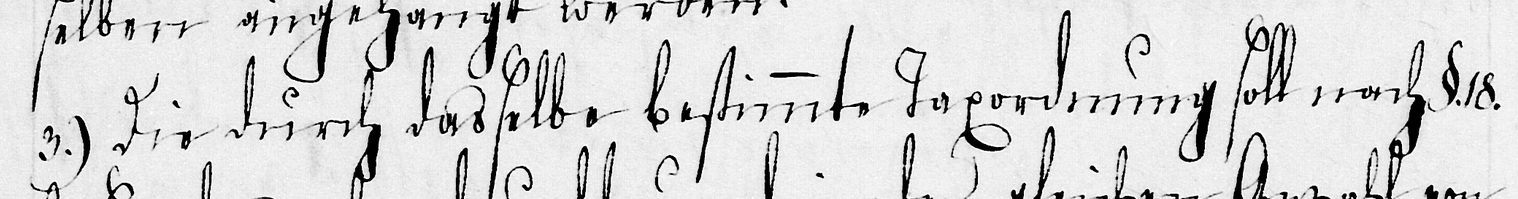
3.) Die durch dasselbe bestimmte Taxordnung soll nach §.
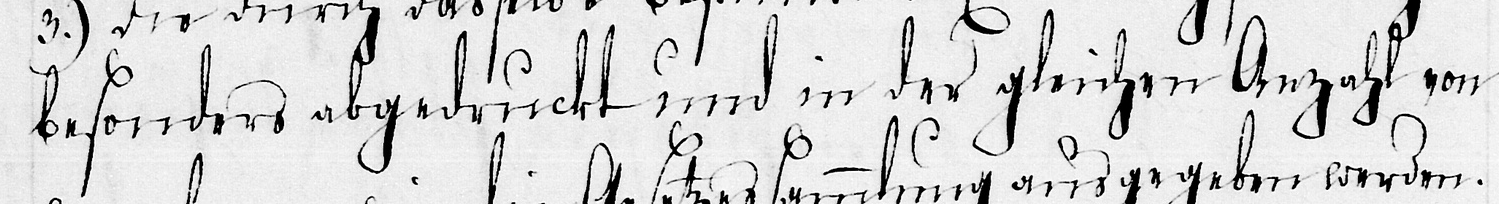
besonders abgedruckt und in der gleichen Anzahl von
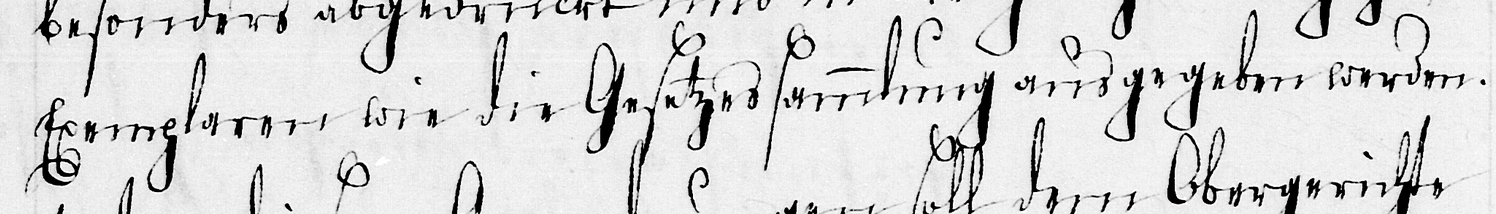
Exemplaren wie die Gesetzessammlung ausgegeben werden.
